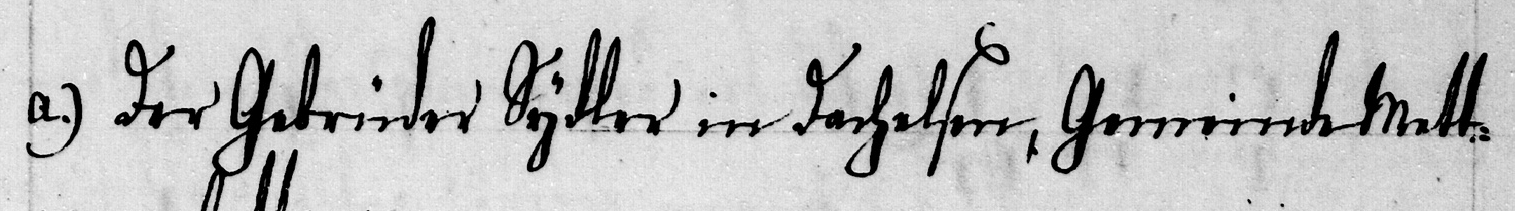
a.) Der Gebrüder Sydler in Dachelsen, Gemeinde Mett¬
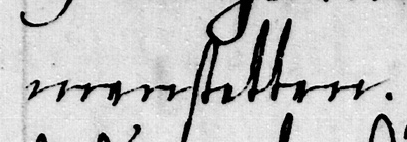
menstetten.
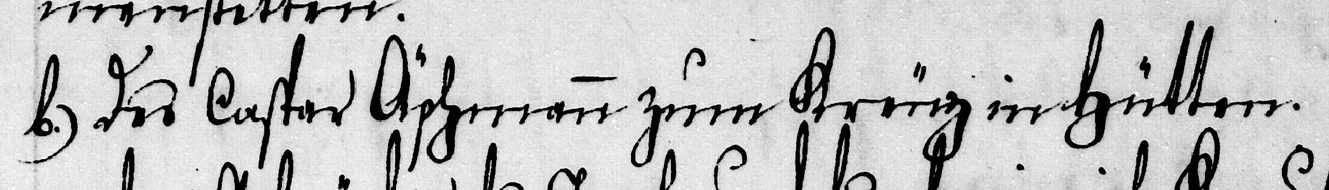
b.) Des Caspar Öschmann zum Kreuz in Hütten.
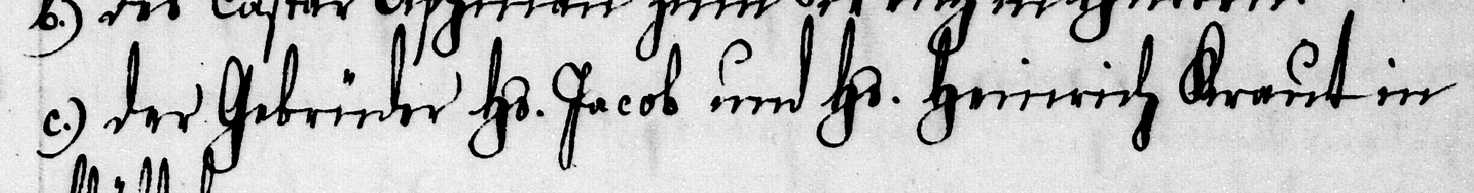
c.) der Gebrüder Hs. Jacob und Hs. Heinrich Kraut in
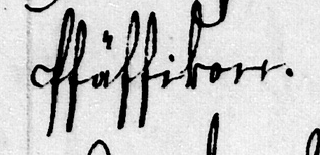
Pfäffikon.
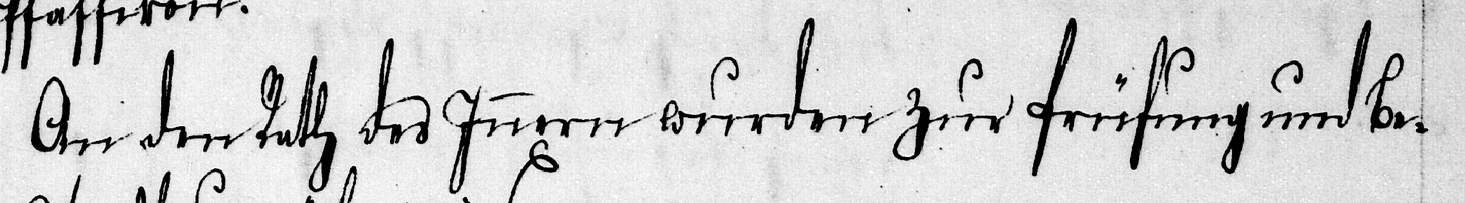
An den Rath des Innern wurden zur Prüfung und Be¬
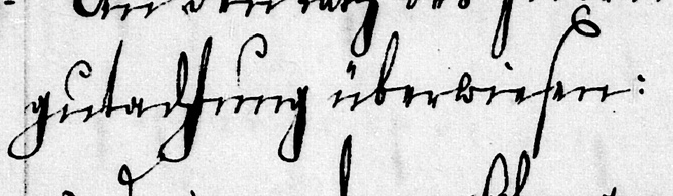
gutachtung überwiesen:
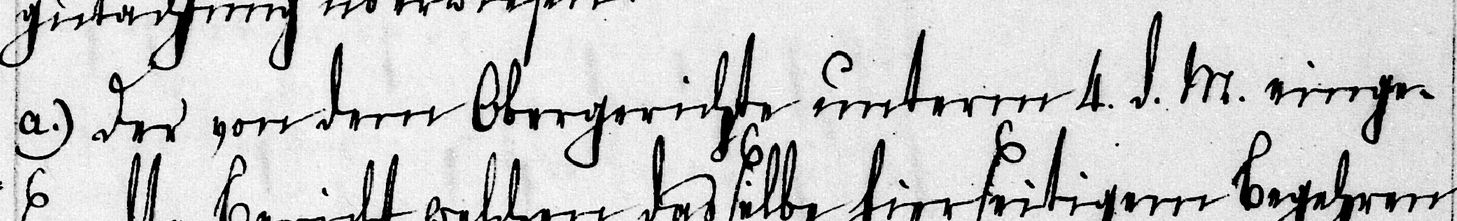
a.) Der von dem Obergerichte unterm 4. d. M. einge¬
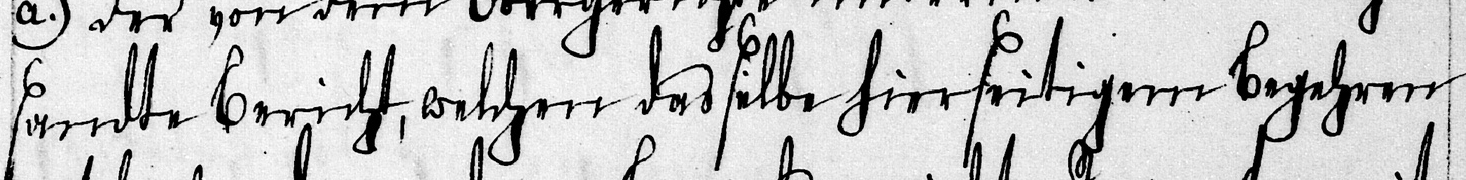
sandte Bericht, welchen dasselbe hierseitigem Begehren
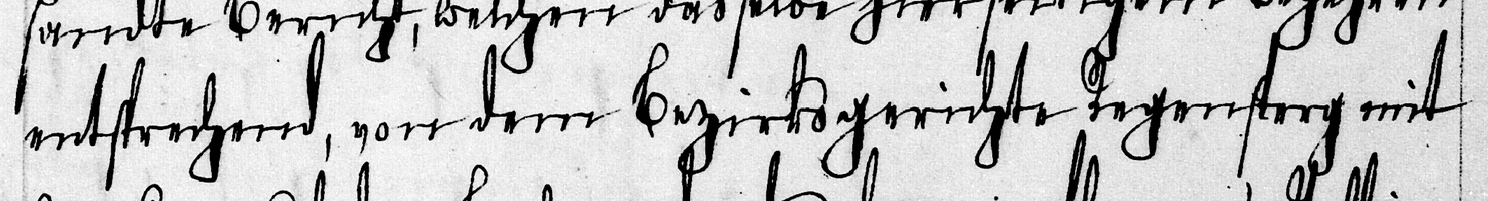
entsprechend, von dem Bezirksgerichte Regensperg mit
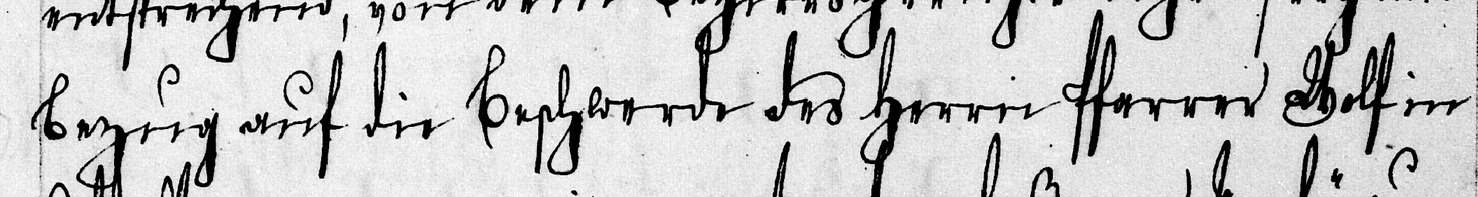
Bezug auf die Beschwerde des Herrn Pfarrer Wolf in
